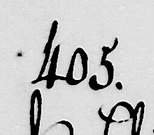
140.
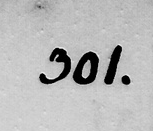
130.
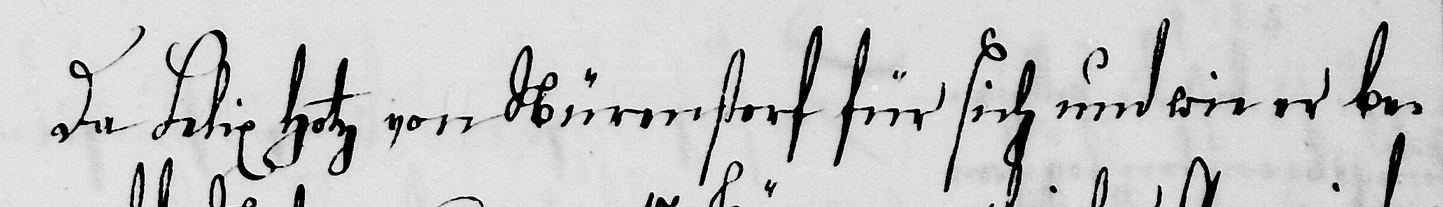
Da Felix Hotz von Nürenstorf für ich und wie er be¬
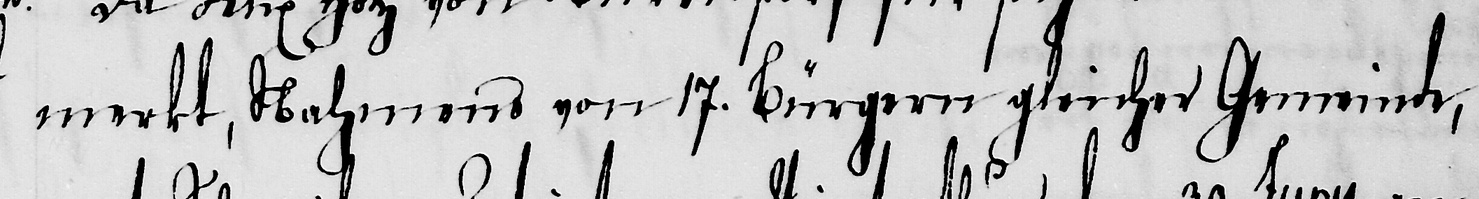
merkt, Nahmens von 17. Bürgern gleicher Gemeinde,
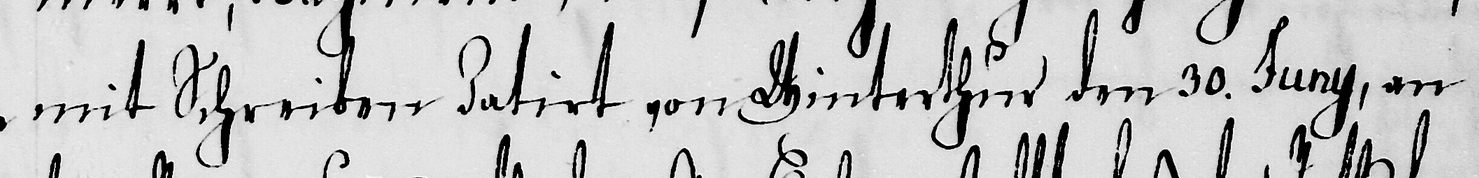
mit Schreiben datirt von Winterthur den 30. Juny, an
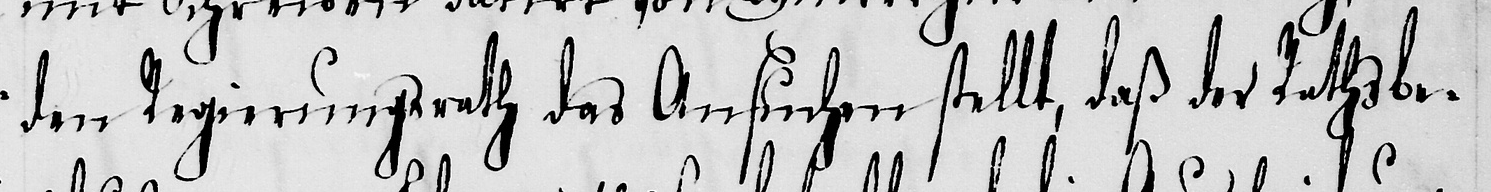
den Regierungsrath das Ansuchen stellt, daß der Rathsbes¬
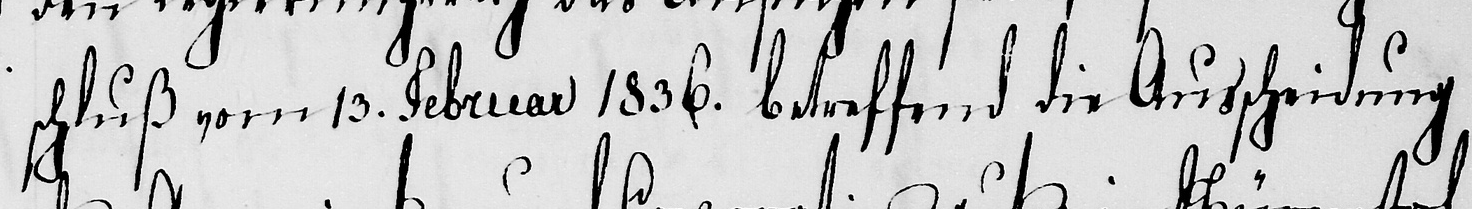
chluß vom 13. Februar 1836. betreffend die Ausscheidung
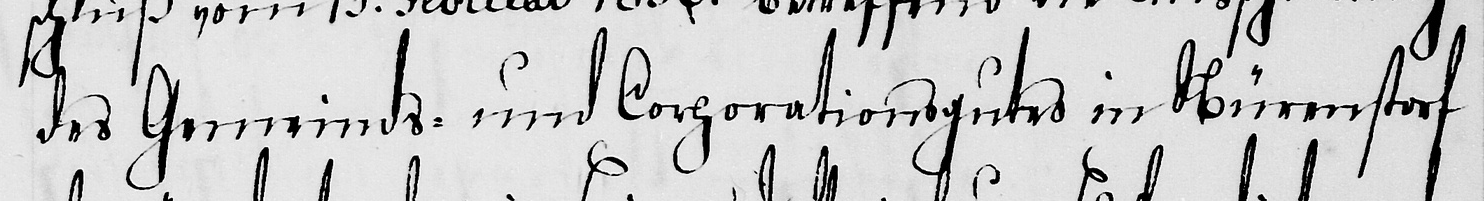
des Gemeinds- und Corporationsgutes in Nürenstorf
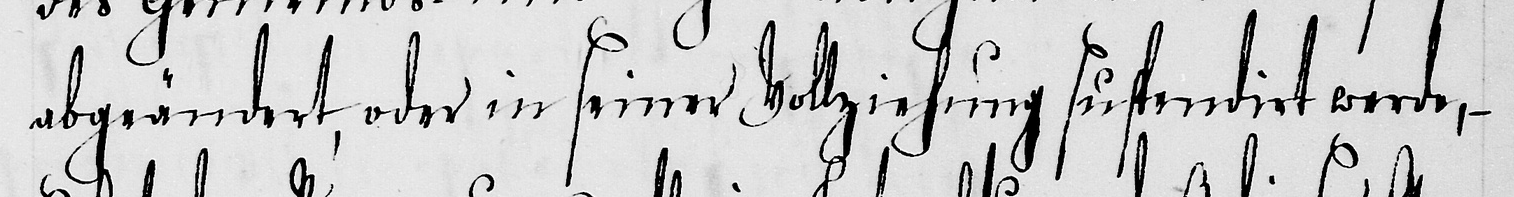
abgeändert, oder in seiner Vollziehung supendirt werde,
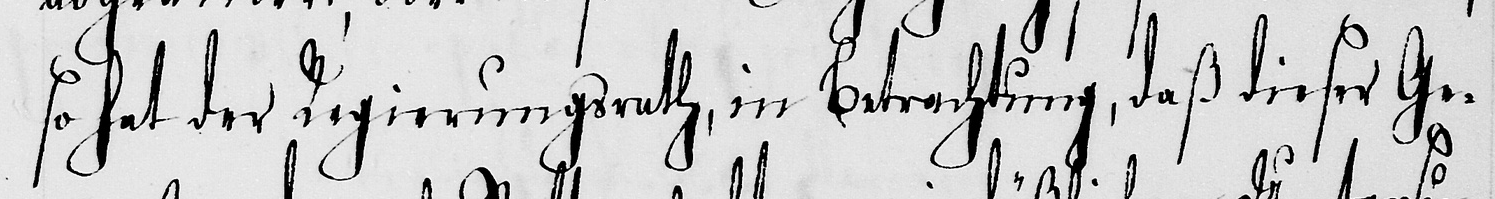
so hat der Regierungsrath, in Betrachtung, daß dieser Ge¬
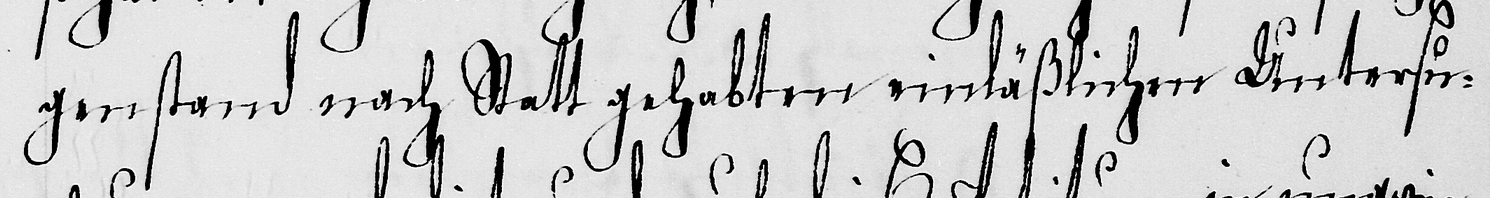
genstand nach Statt gehabten einläßlichen Untersu¬
